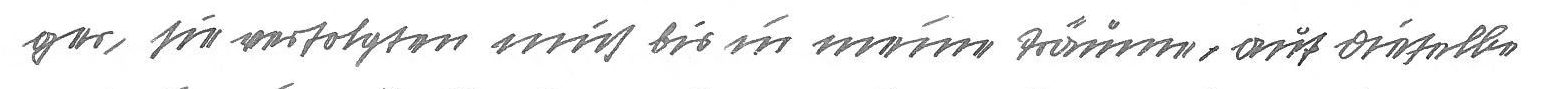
ger, sie verfolgten mich bis in meine Träume, auf dieselbe
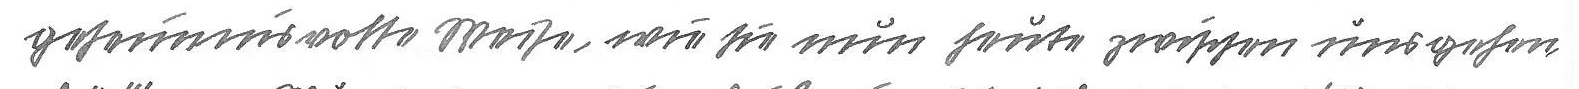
geheimnisvolle Weise, wie sie nun heute zwischen uns gehen
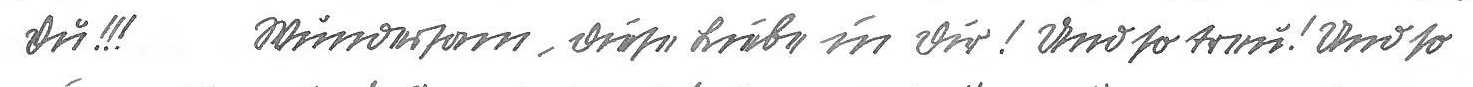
Du!!! Wundersam, diese Liebe in Dir! Und so treu! Und so
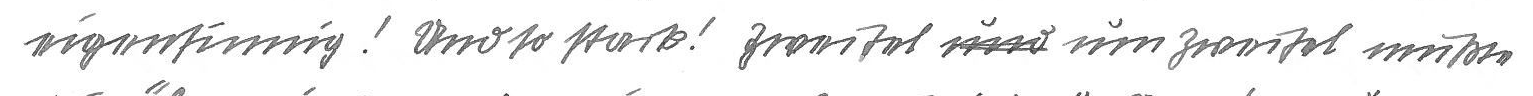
eigensinnig! Und so stark! Zweifel und um Zweifel mußte
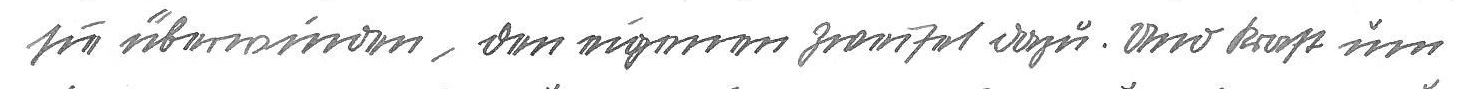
sie überwinden, den eigenen Zweifel dazu. Und Kraft um
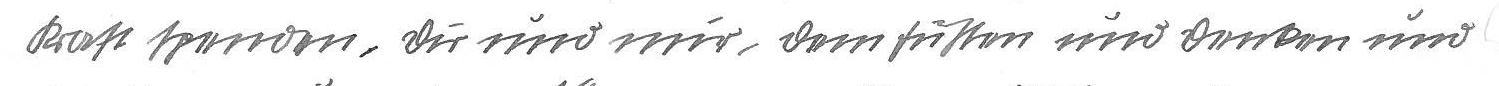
Kraft spenden, Dir und mir, dem Fühlen und Denken und
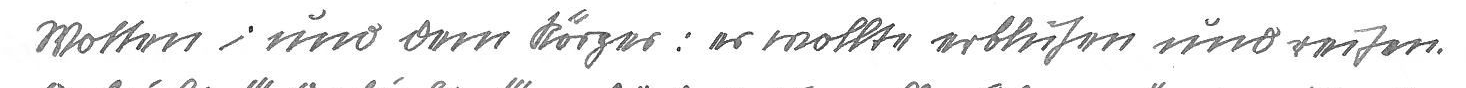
Wollen; und dem Körper: er wollte erblühen und reifen.
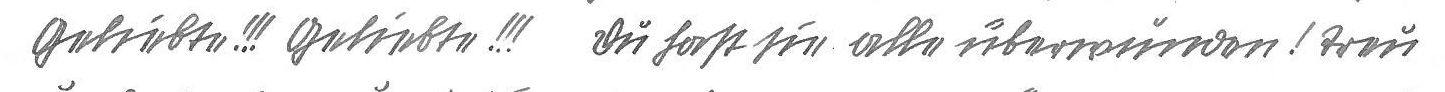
Geliebte!!! Geliebte!!! Du hast sie alle überwunden! Treu
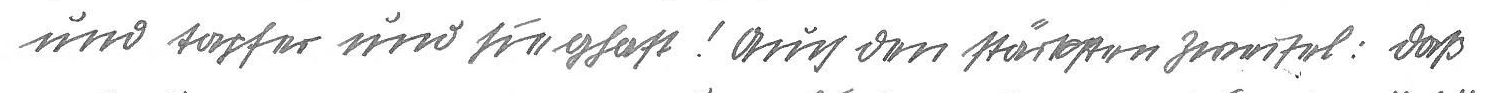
und tapfer und sieghaft! Auch den stärksten Zweifel: Dass
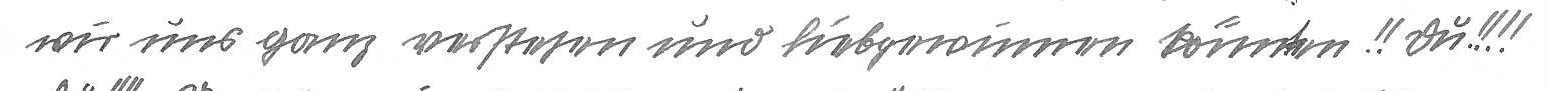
wir uns ganz verstehen und liebgewinnen könnten!! Du!!!
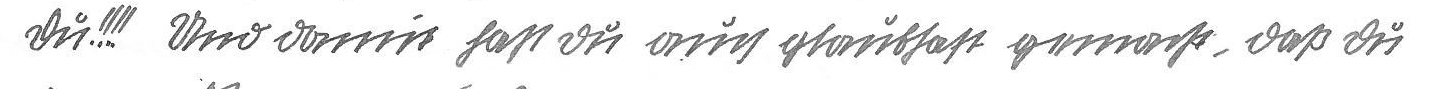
Du!!!! Und damit hast Du auch glaubhaft gemacht, daß Du
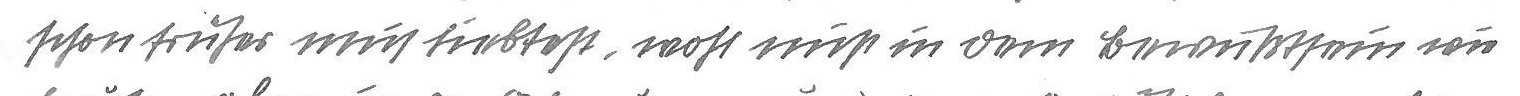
schon früher mich liebtest, wohl nicht in dem Bewußtsein wie
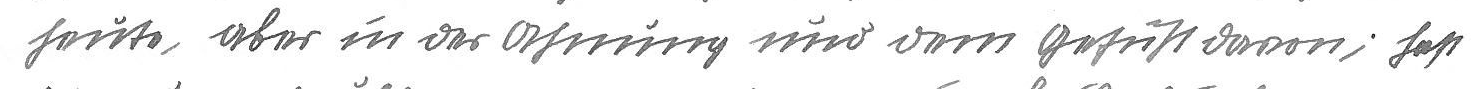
heute, aber in der Ahnung und dem Gefühl davon; hast
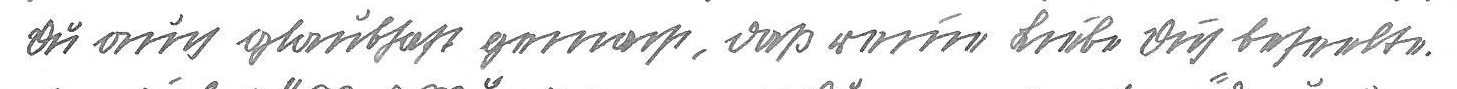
Du auch glaubhaft gemacht, daß reine Liebe Dich beseelte.
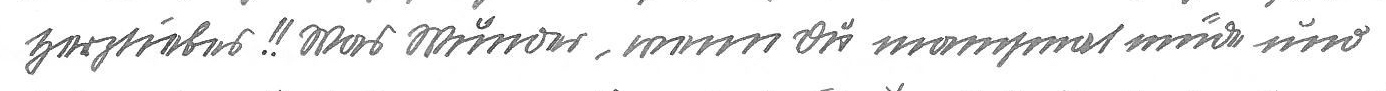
Herzliebes!! Was Wunder, wenn Du manchmal müde und
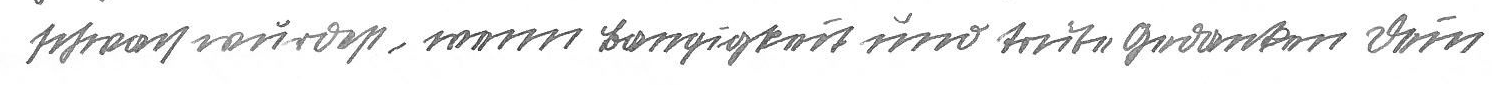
schwach wurdest, wenn Bangigkeit und trübe Gedanken Dein
